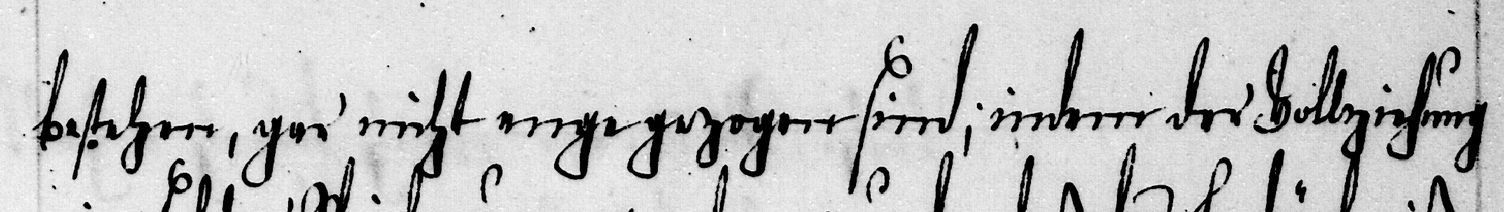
bestehen, gar nicht engegezogen sind; indem der Vollziehung
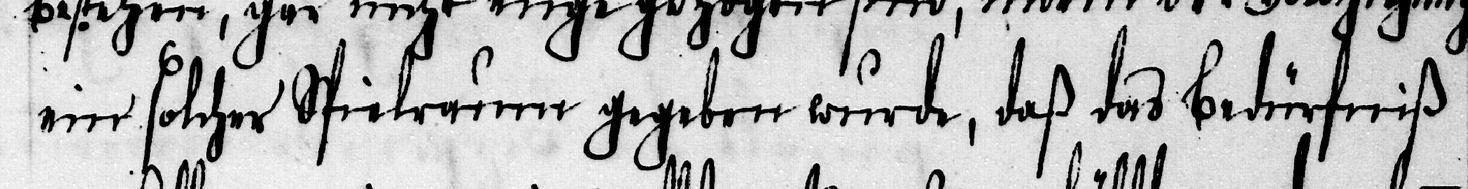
ein solcher Spielraum gegeben wurde, daß das Bedürfniß
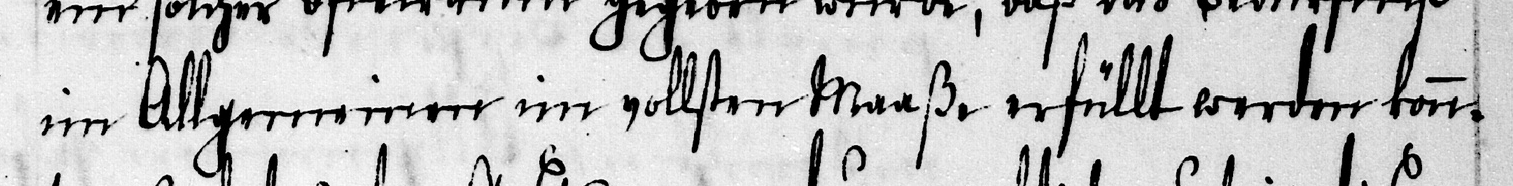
im Allgemeinen im vollsten Maaße erfüllt werden konn¬
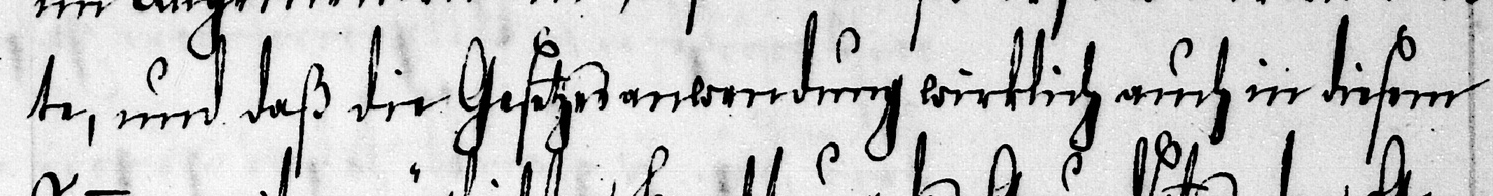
te, und daß die Gesetzesanwendung wirklich auch in diesem
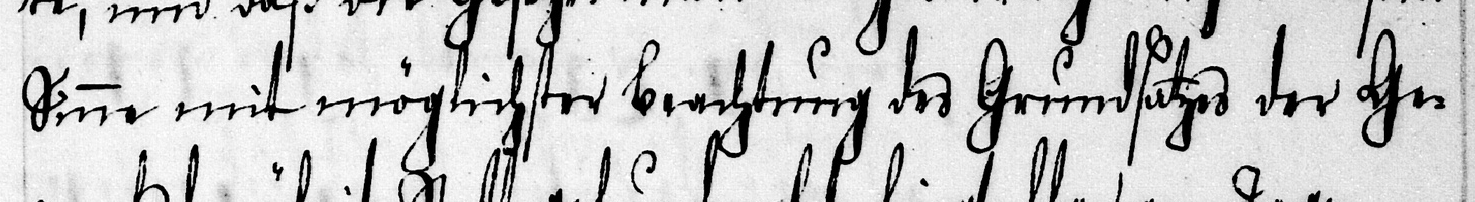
Sinne mit möglichster Beachtung des Grundsatzes der Ge¬
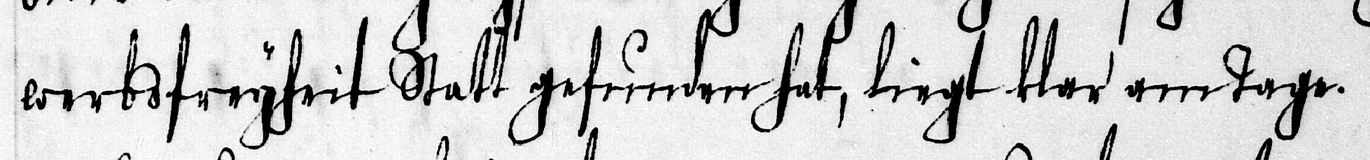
werbsfreyheit Statt gefunden hat, liegt klar am Tage.
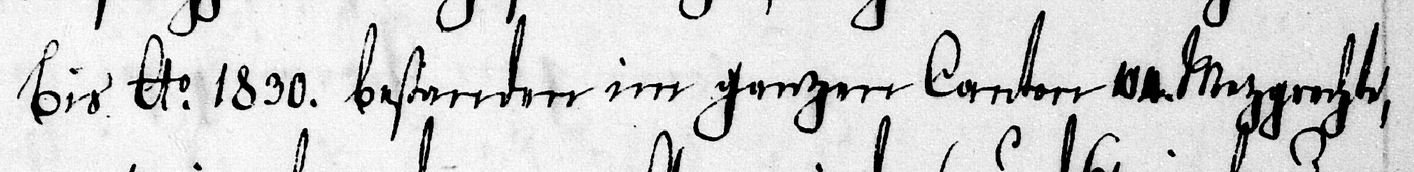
Bis Ao. 1830 bestanden im ganzen Canton 104. Metzgrechte,
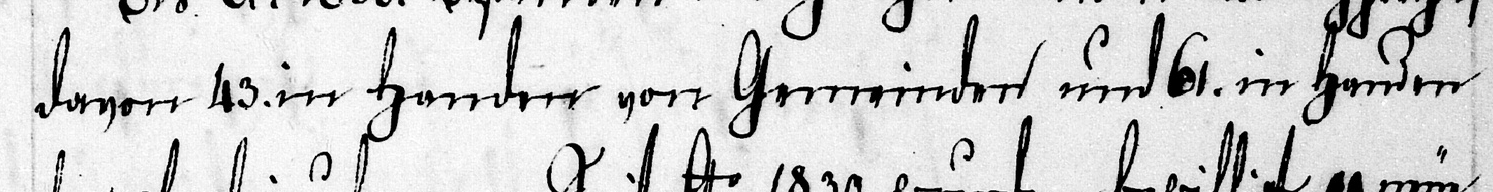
davon 43. in Handen von Gemeinden und 61. in Handen
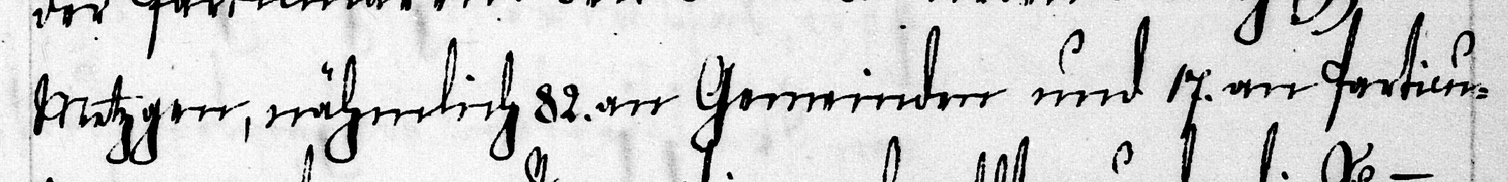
Metzgen, nähmlich 82. an Gemeinden und 17. an Particu¬
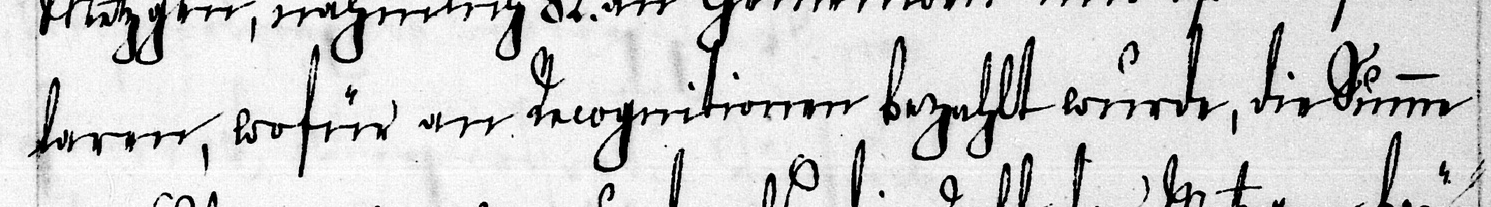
laren, wofür an Recognitionen bezahlt wurde, die Summe
